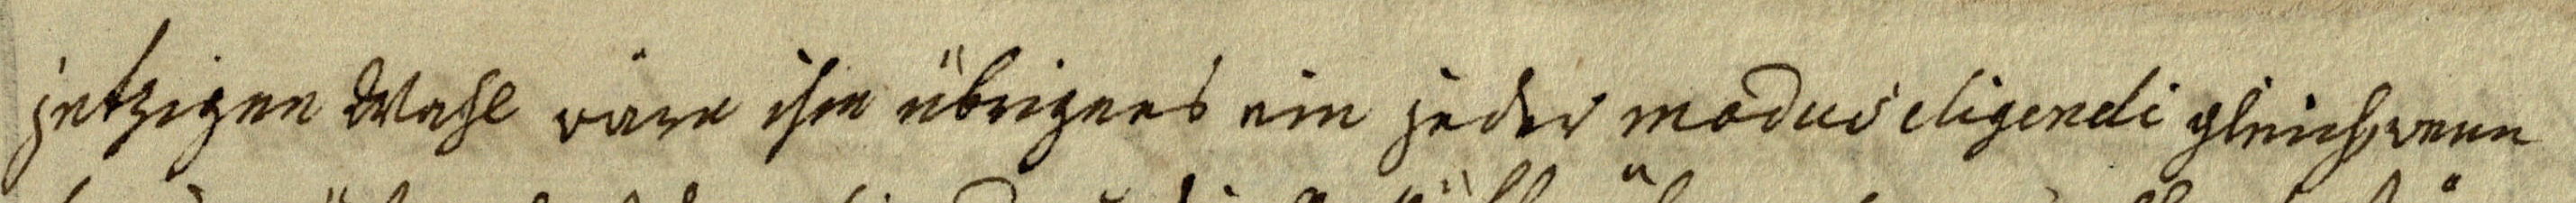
jetzigen Wahl wäre ihm übrigens ein jeder modus eligendi gleich,wenn
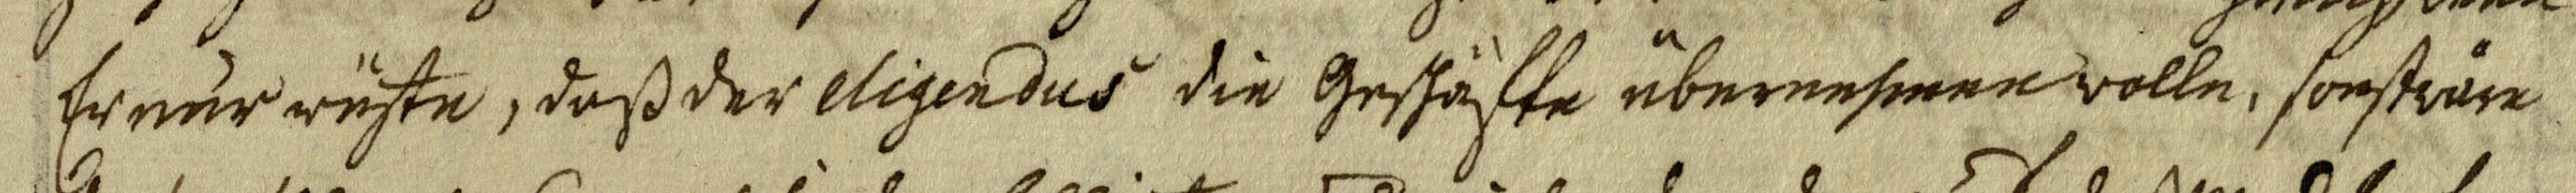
Er nur wüste, daß der eligendus die Geschäfte übernehmen wolle, sonst wäre
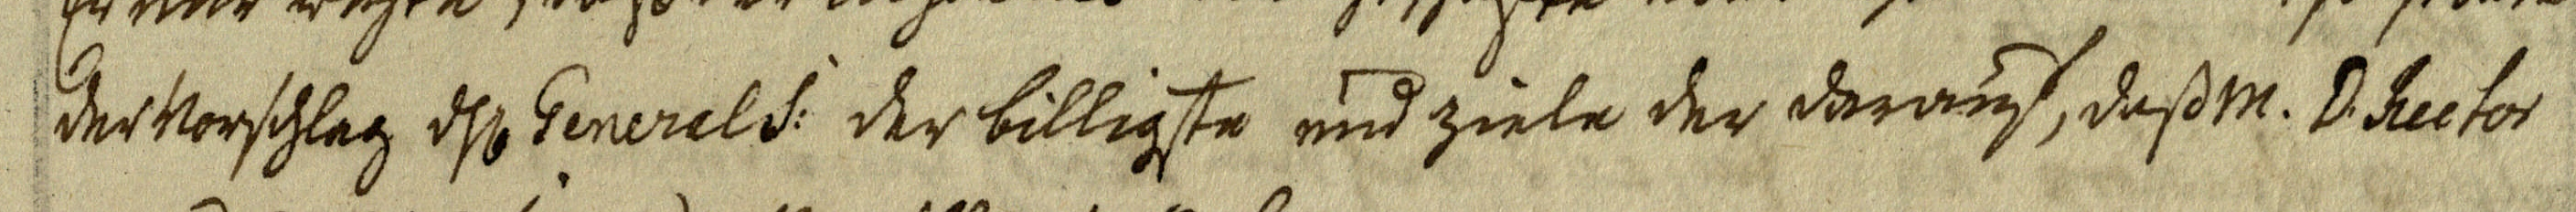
der Vorschlag dh GeneralS. der billigste und ziele der darauf, daß M. D. Rector
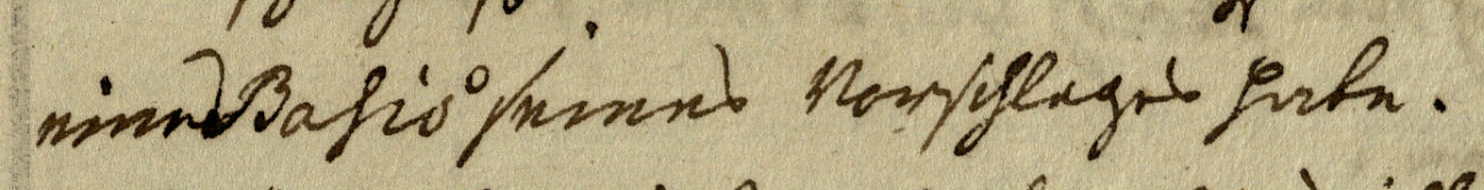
eine Basis seines Vorschlages habe.
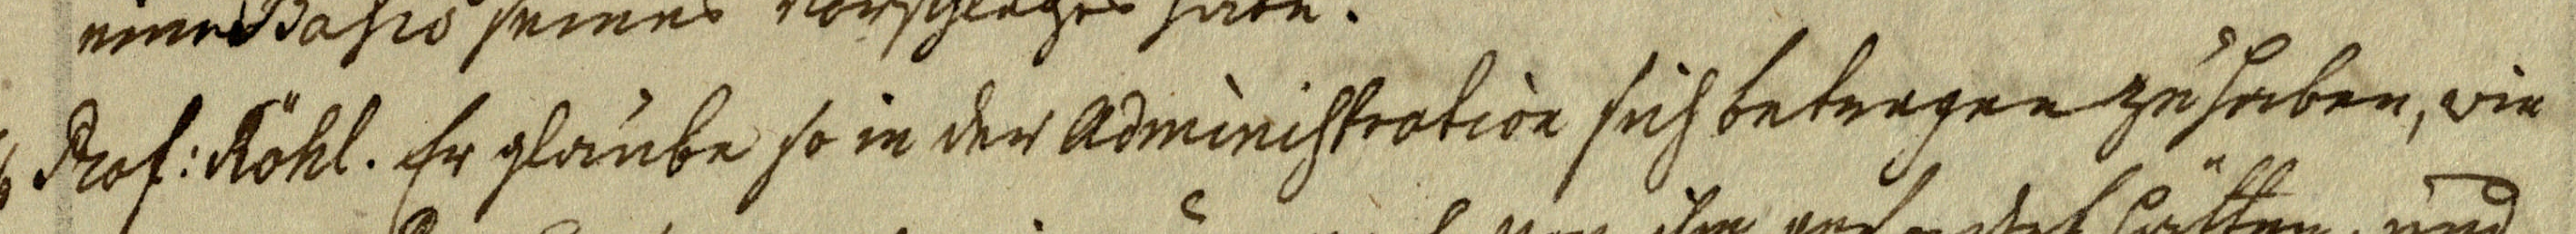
dh Prof. Röhl. Er glaube so in der Administration sich betragen zu haben, wie
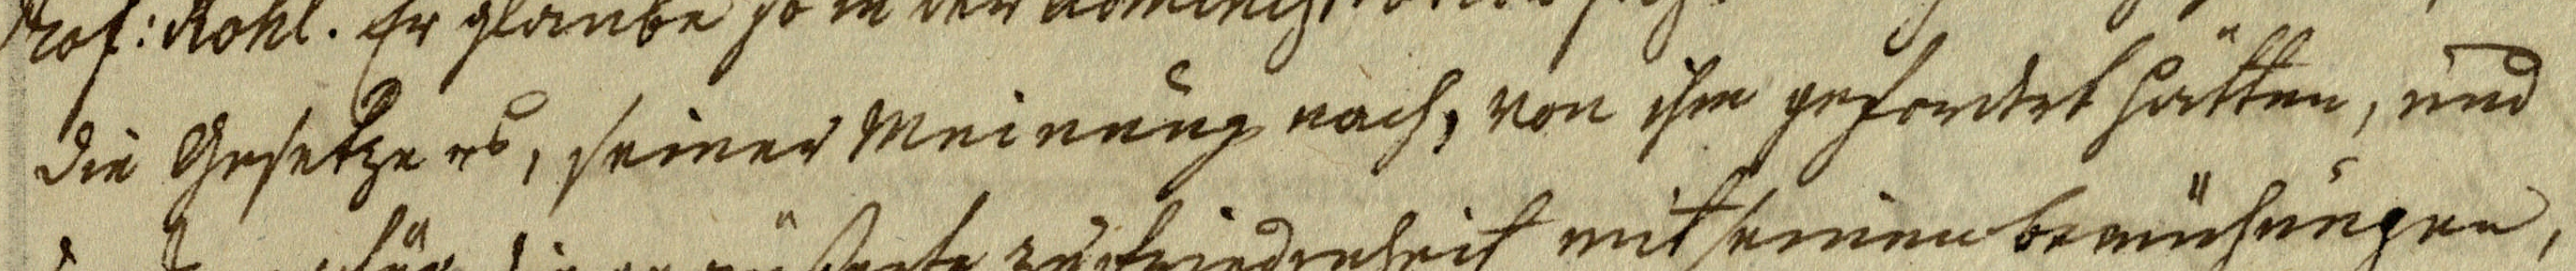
die Gesetze es, seiner Meinung nach, von ihm gefordert hätten, und
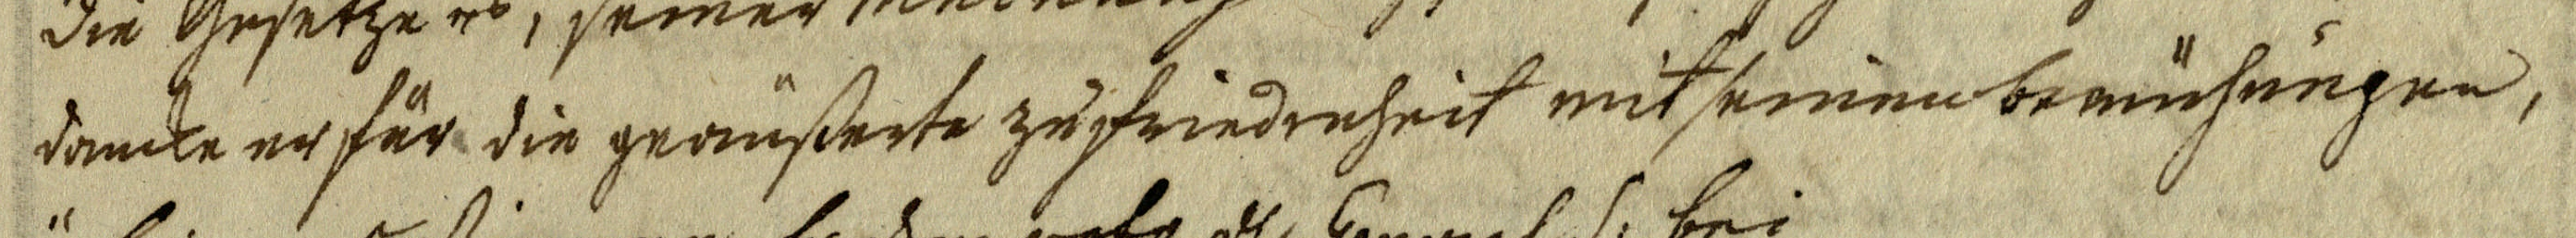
danke er für die geäußerte Zufriedenheit mit seinen Bemühungen,
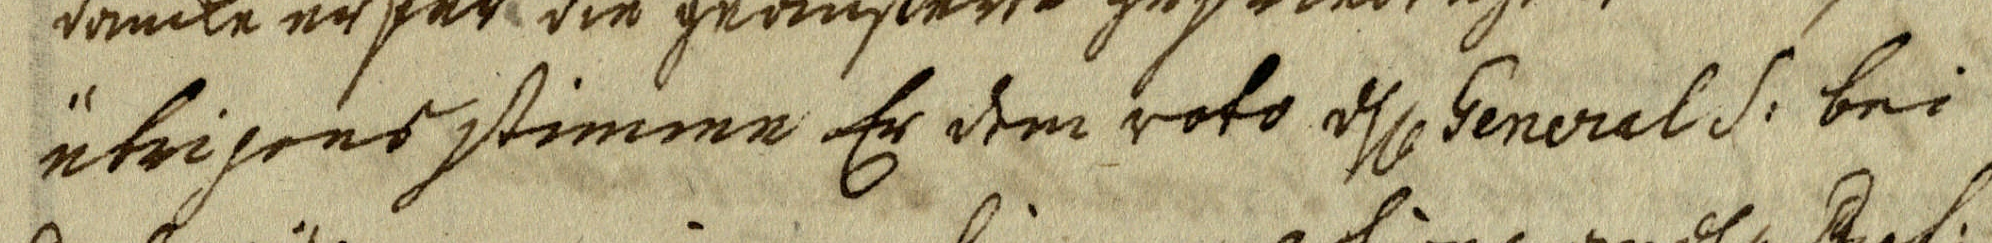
übrigens stimme Er dem voto dh GeneralS. bei
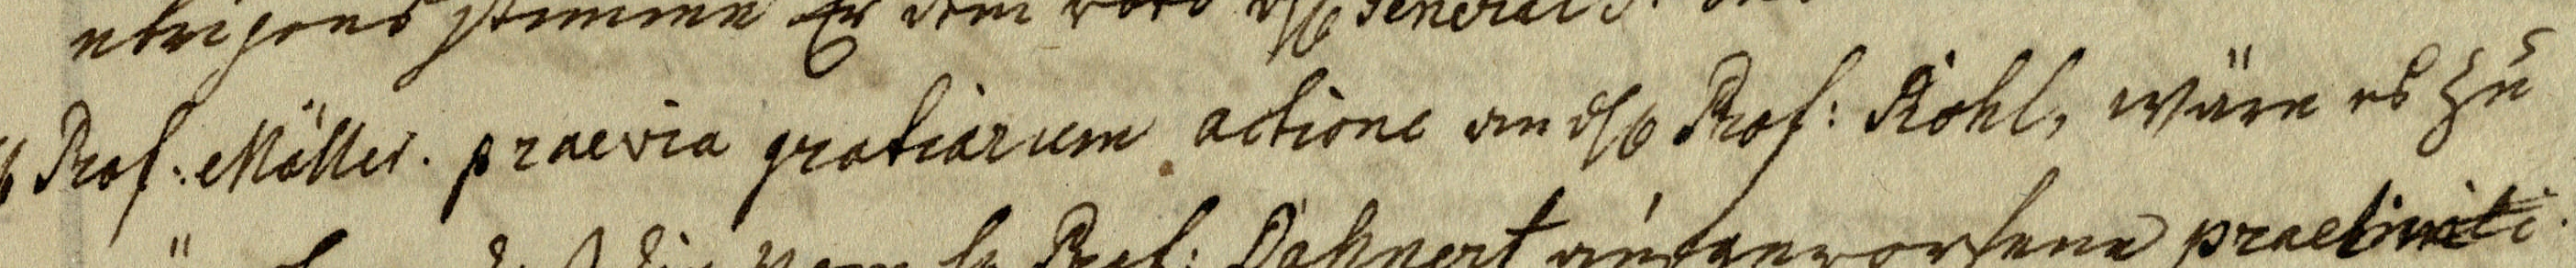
dh Prof. Möller. praevia gratiarum actione an dh Prof: Röhl, wäre es zu
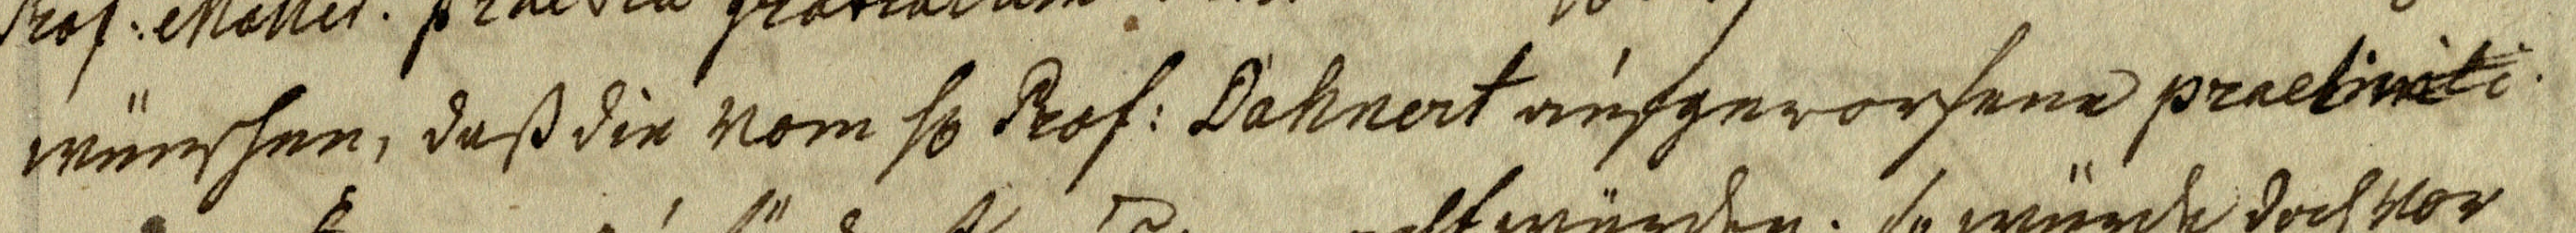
wünschen, daß die vom h Prof. Dähnert aufgeworfene praelimi¬
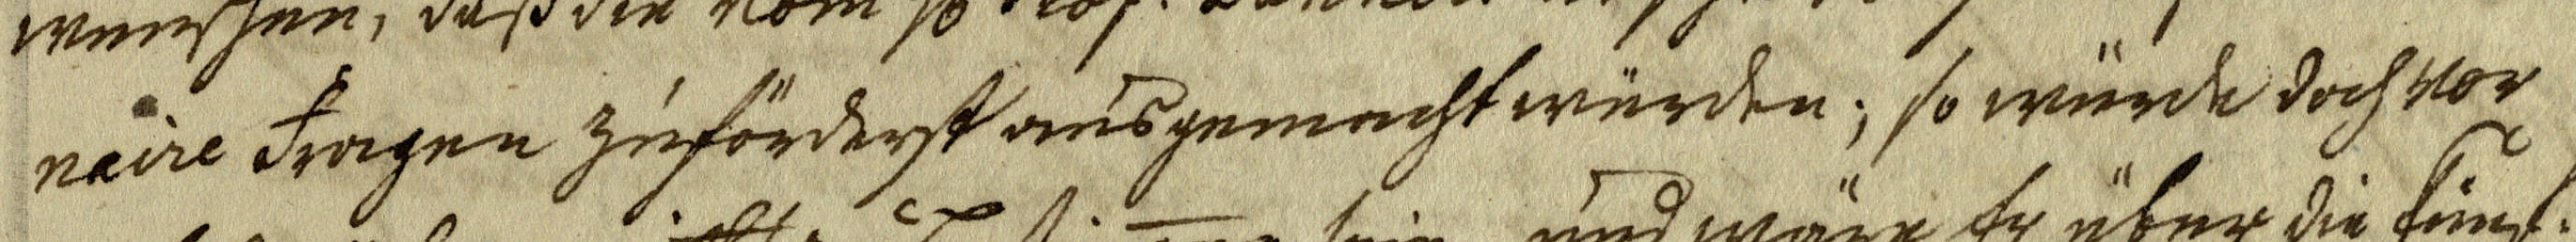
naire Fragen zuförderst ausgemacht würden; so würde doch vor
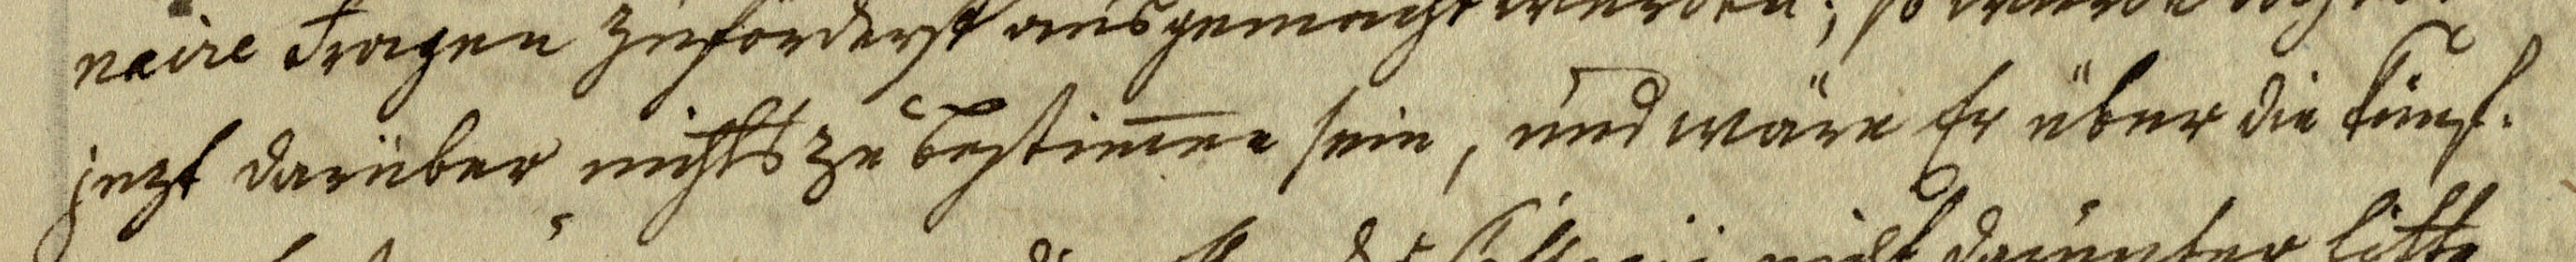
jezt darüber nichts zu bestimen sein, und wäre Er über die künf¬
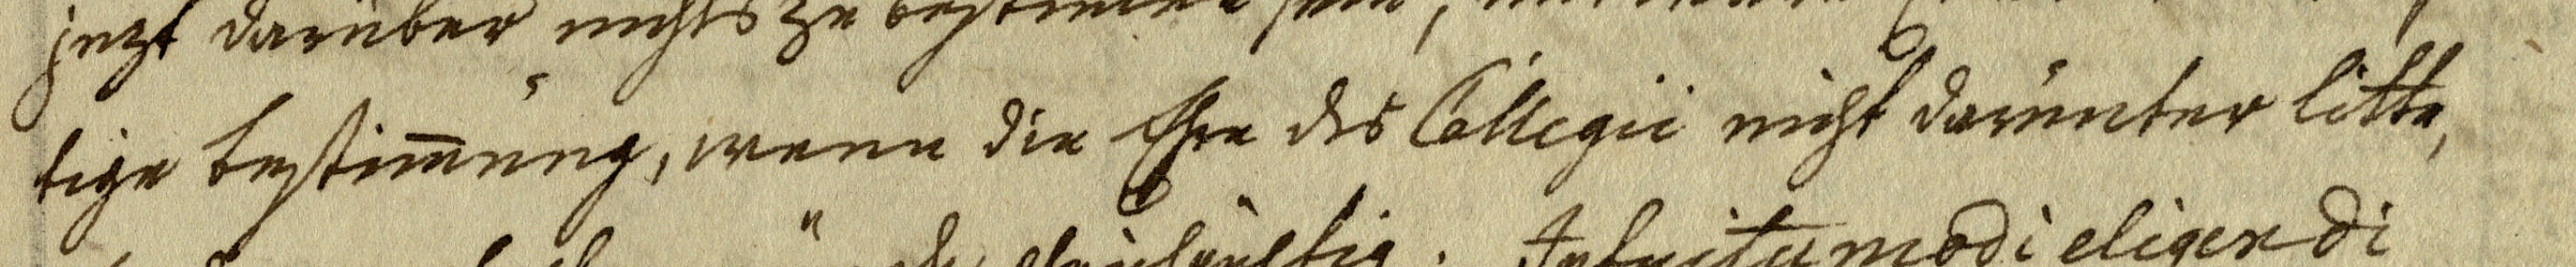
tige Bestimung, wenn die Ehre des Collegii nicht darunter litte,
